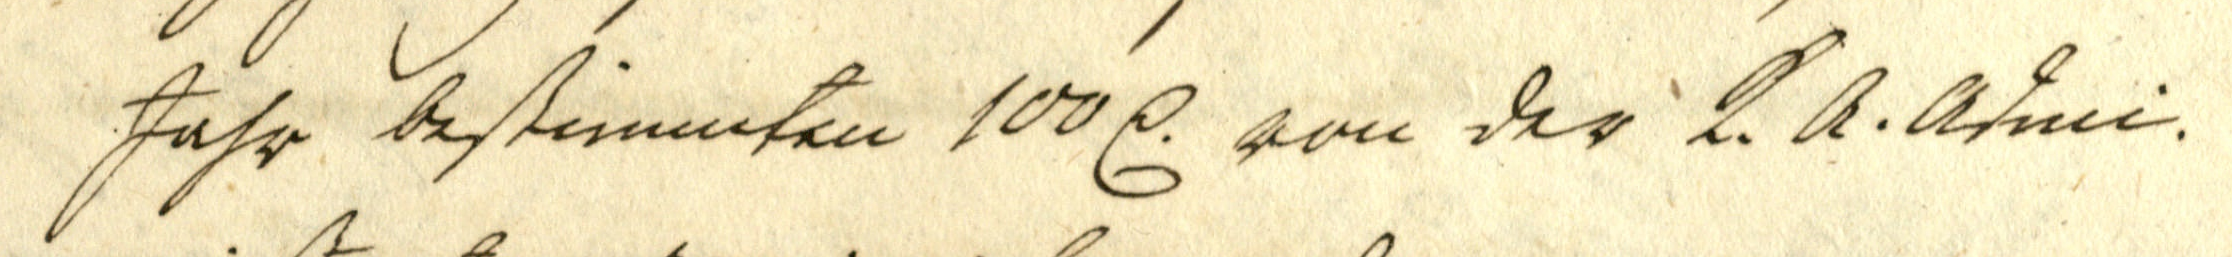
Jahr bestimmten 100 l. von der K. A. Admi¬
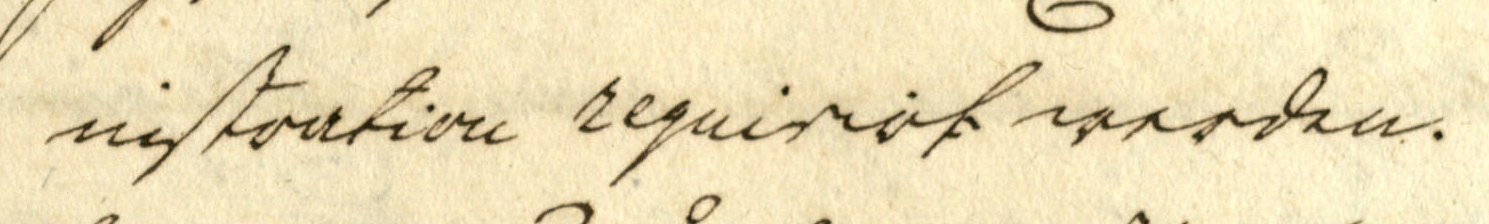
nistration requirirt werden.
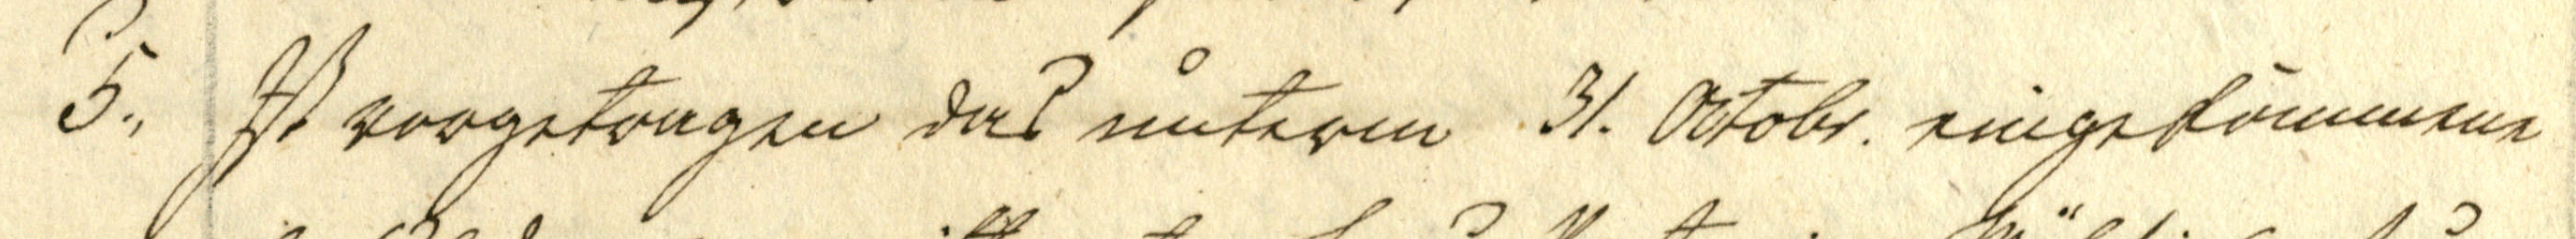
5., Ist vorgetragen das unterm 31. Octobr. eingekommene
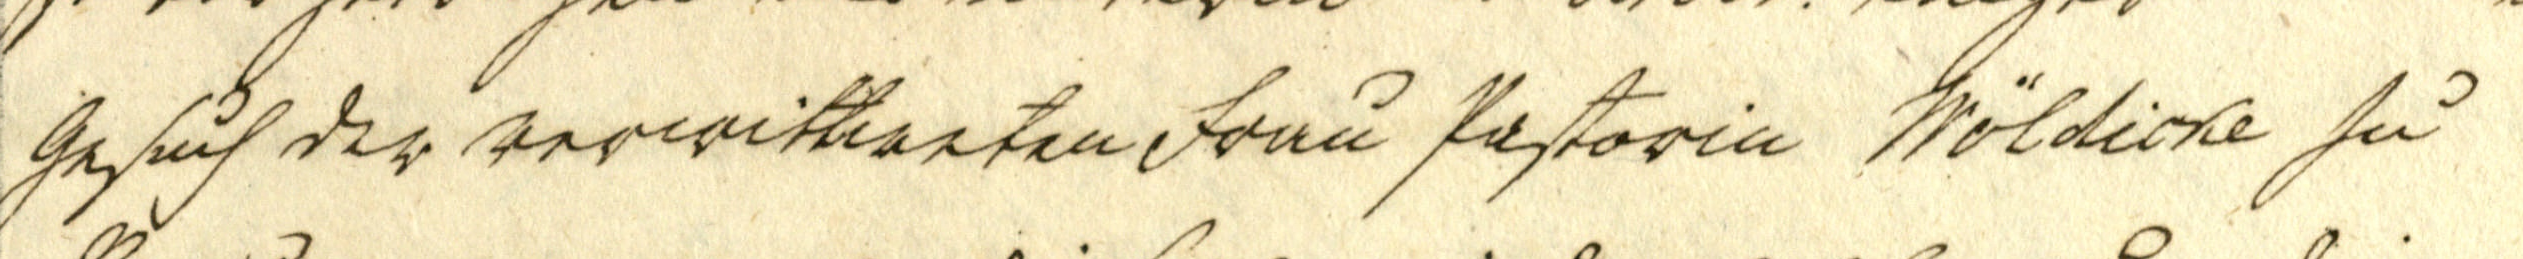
Gesuch der verwittweten Frau Pastorin Wöldicke zu
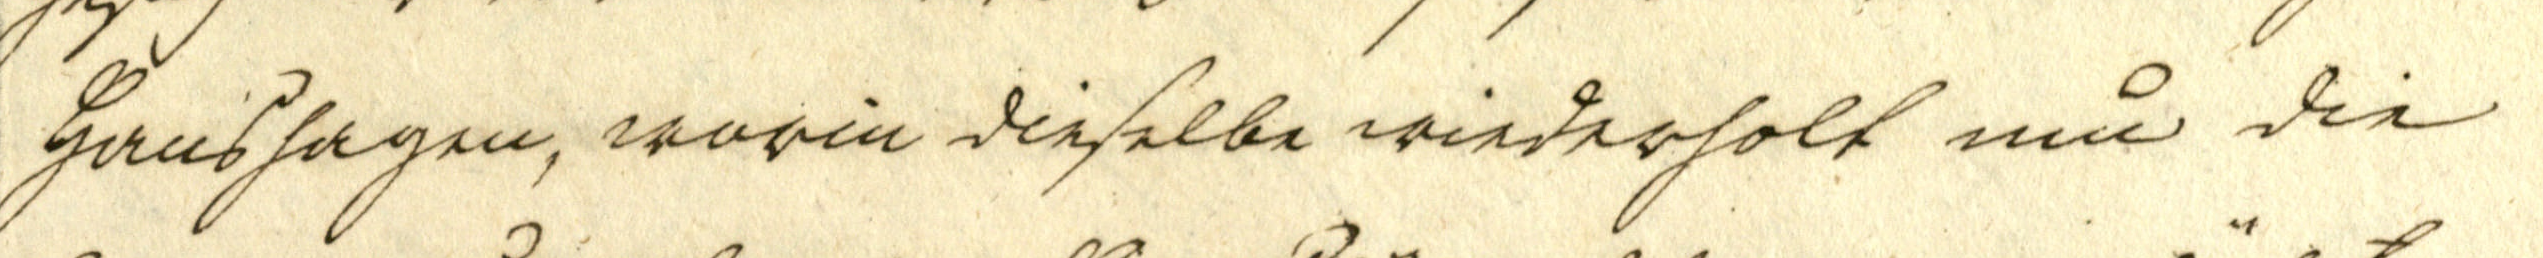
Hanshagen, worin dieselbe wiederholt um die
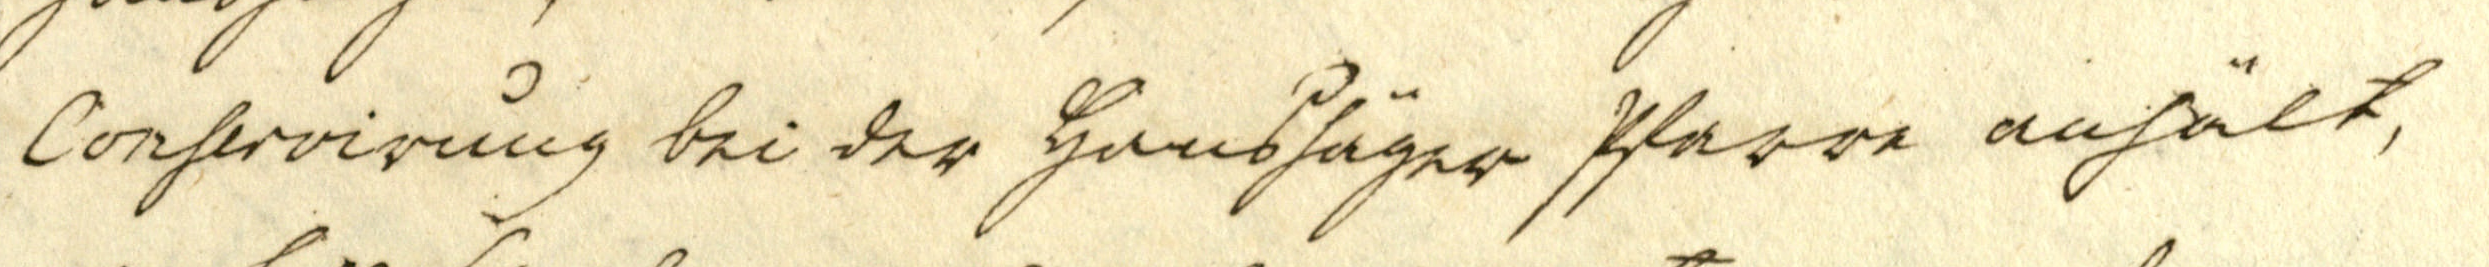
Conservirung bei der Hanshäger Pfarre anhält,
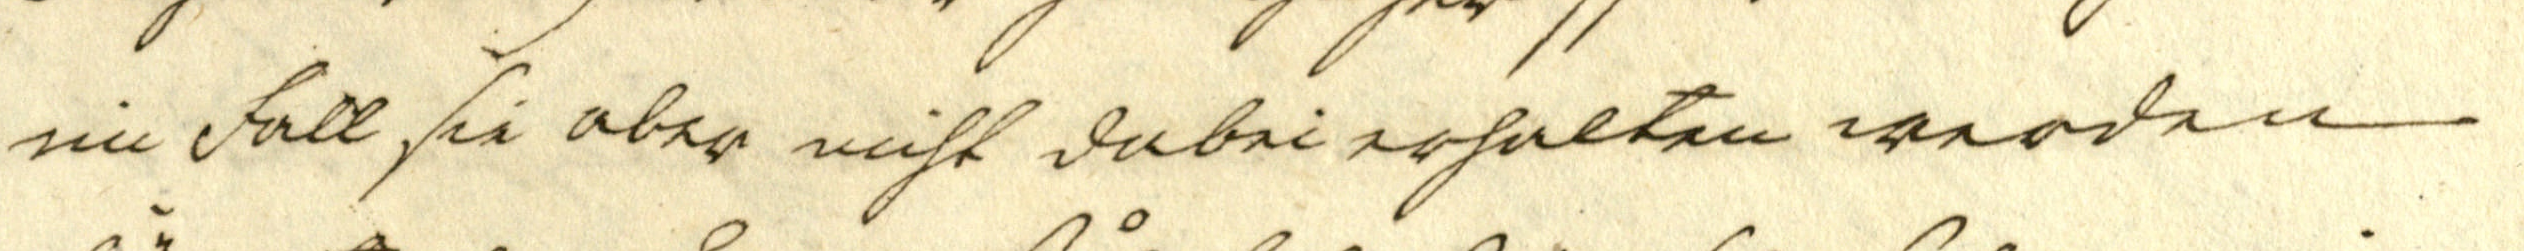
im Fall sie aber nicht dabei erhalten werden
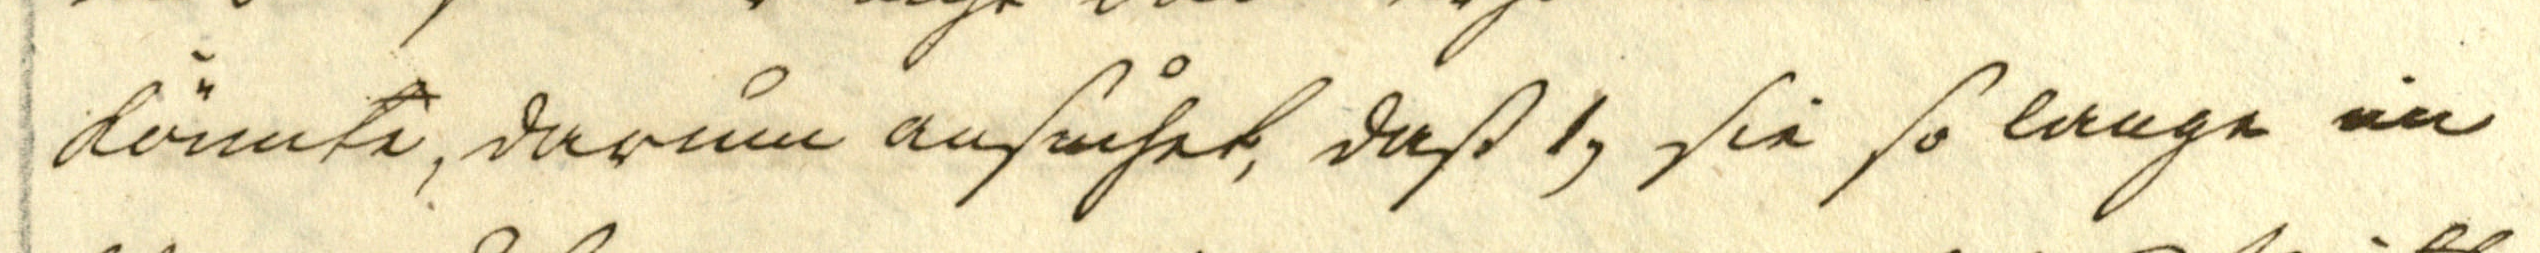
könnte, darum ansuchet, daß 1., sie so lange im
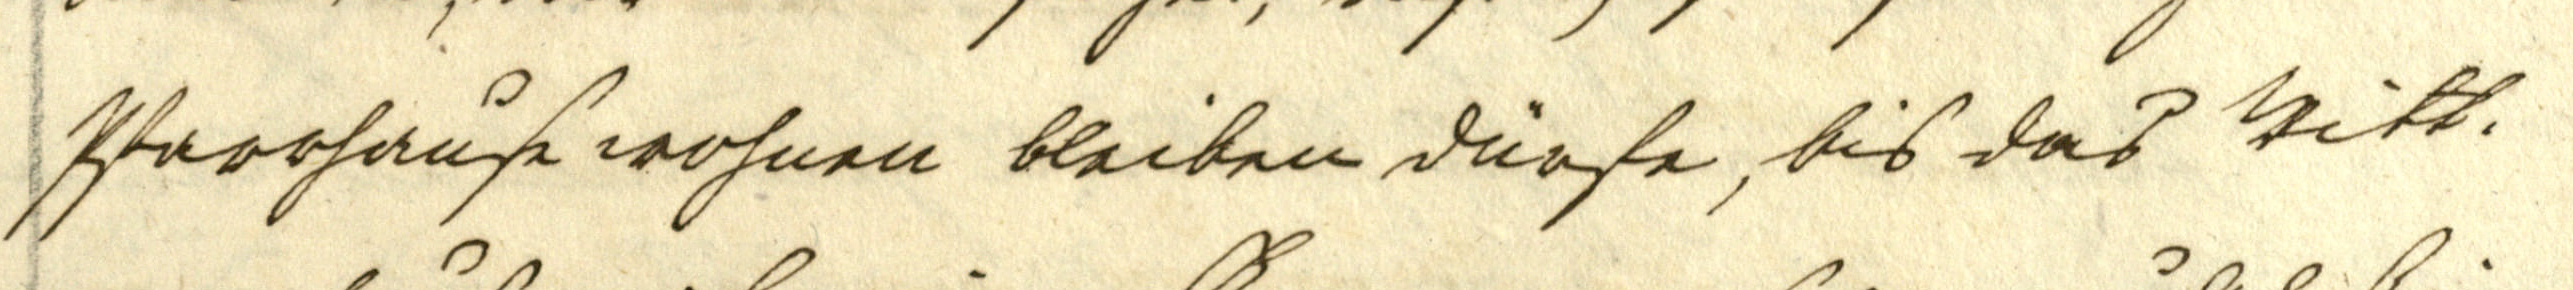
Pfarrhause wohnen bleiben dürfe, bis das Witt¬
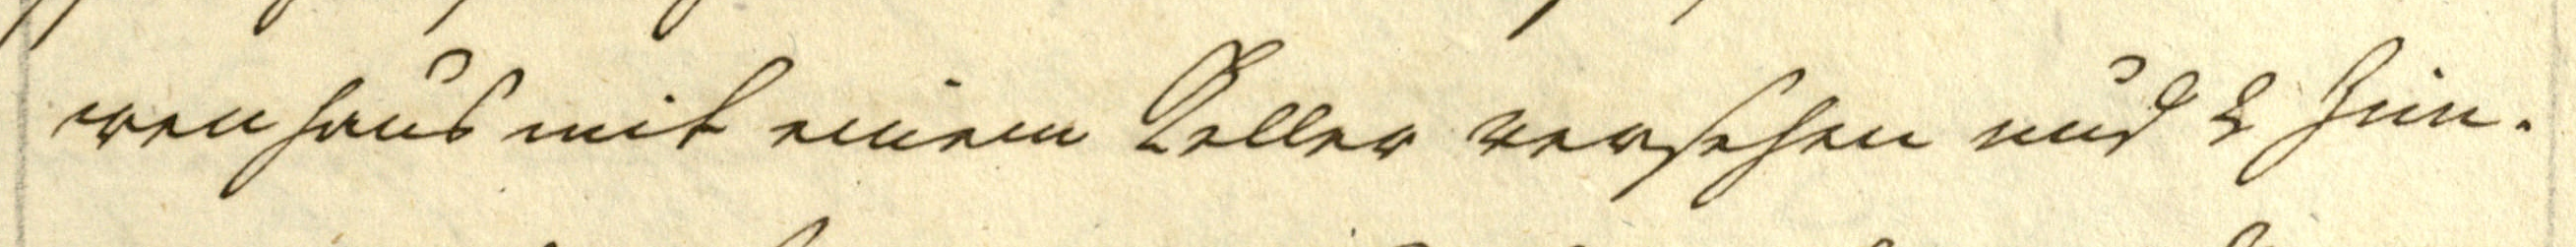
wenhaus mit einem Keller versehen und 2 Zim¬
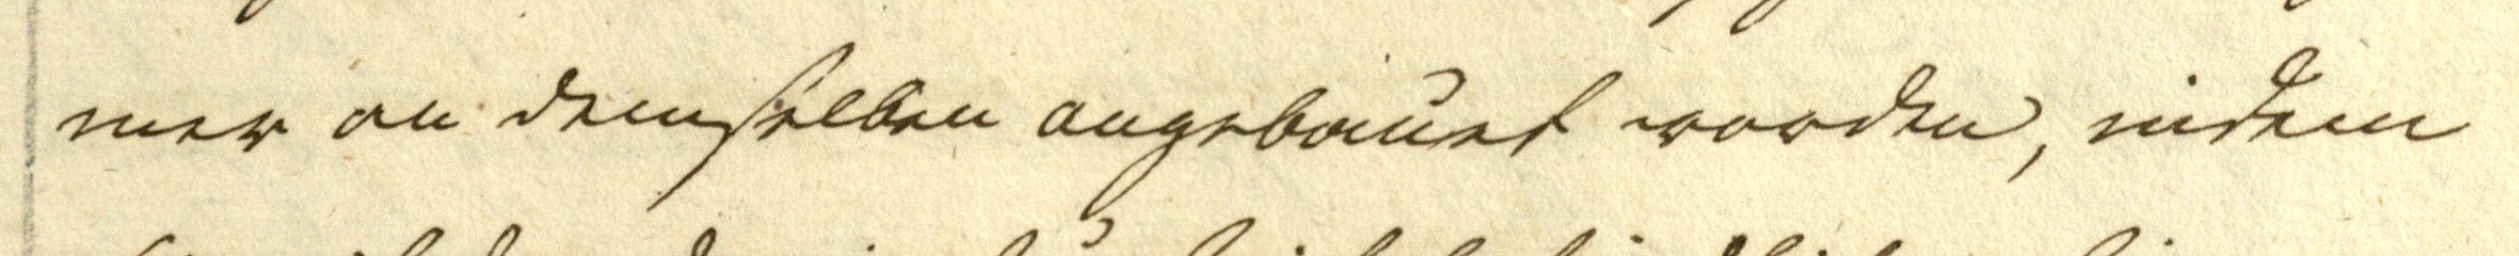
mer an demselben angebauet worden, indem
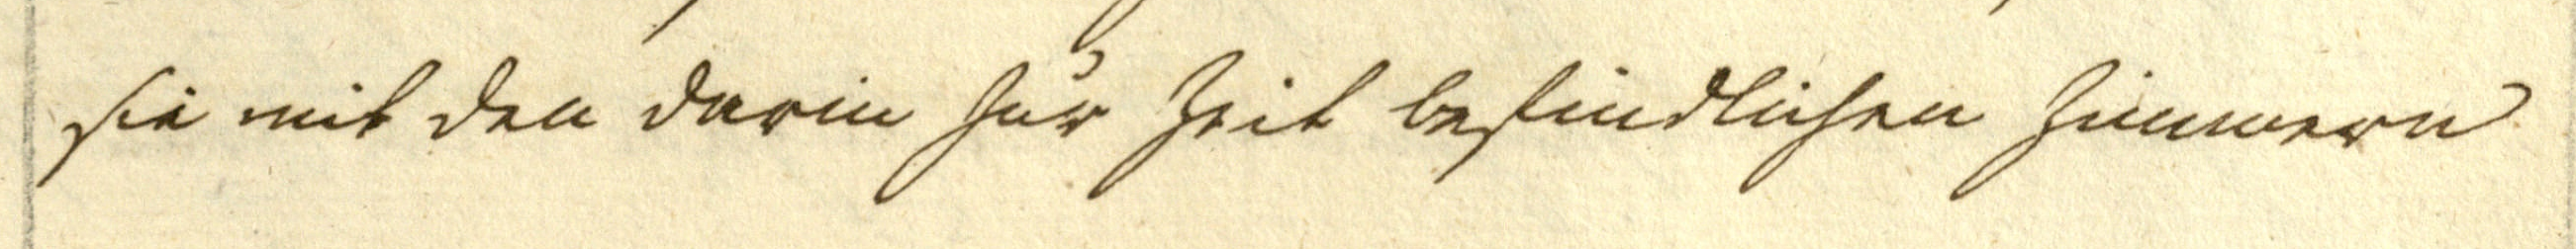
sie mit den darin zur Zeit befindlichen Zimmern
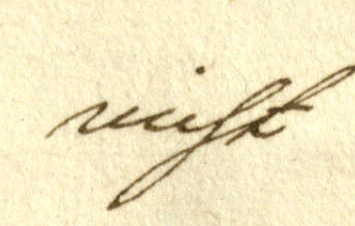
nicht
